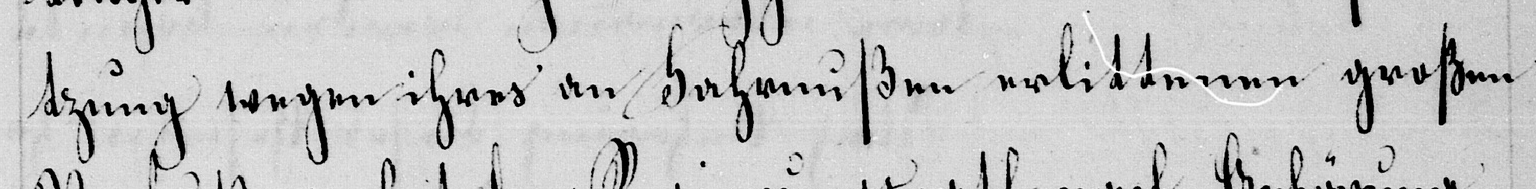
tzung wegen ihres an Fahrnußen erlittenen großen
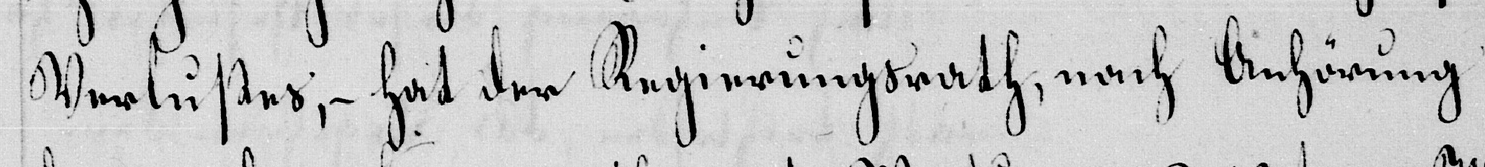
Verlustes, – hat der Regierungsrath, nach Anhörung
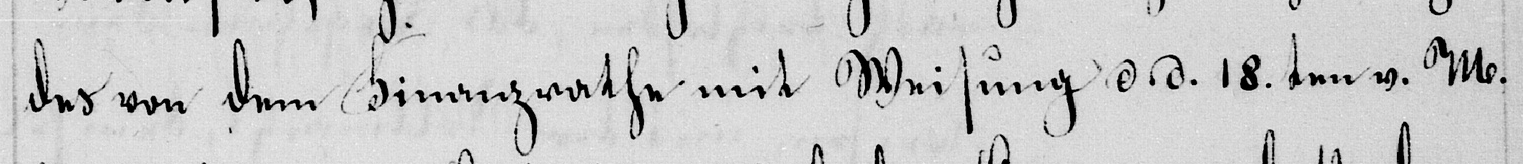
des von dem Finanzrathe mit Weisung d. d. 18.ten v. M.
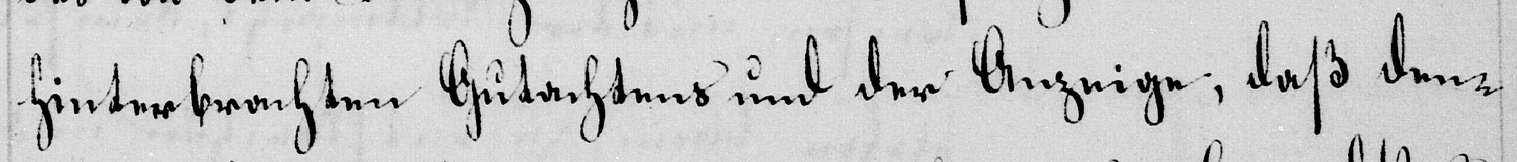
hinterbrachten Gutachtens und der Anzeige, daß den¬
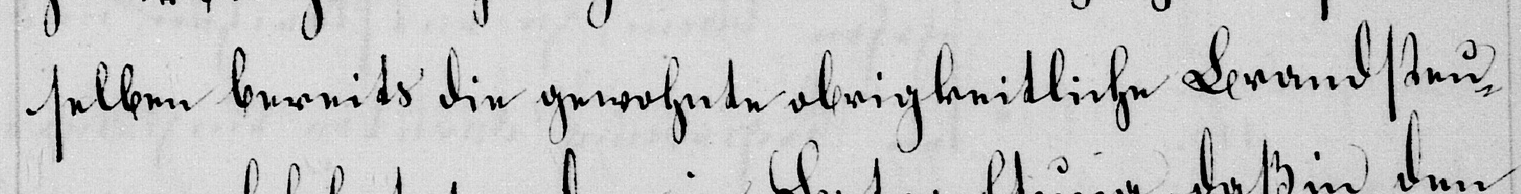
selben bereits die gewohnte obrigkeitliche Brandsteu¬
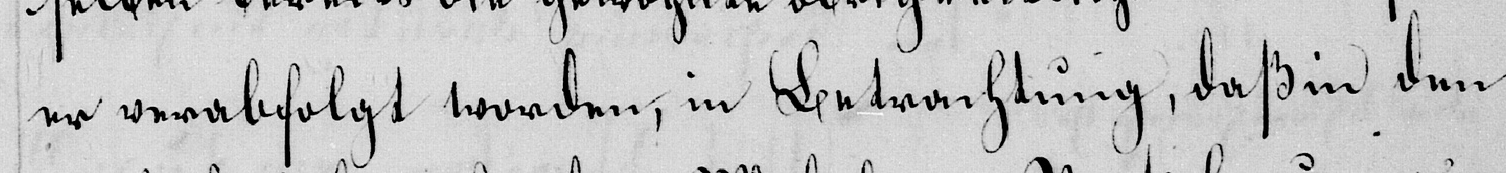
er verabfolgt worden, in Betrachtung, daß in den
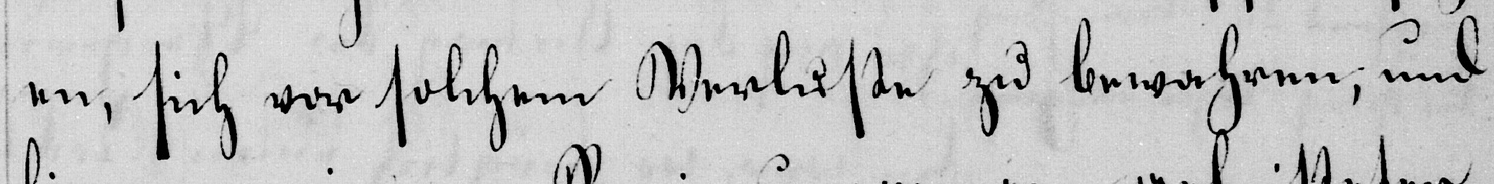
en, sich vor solchem Verluste zu bewahren, und
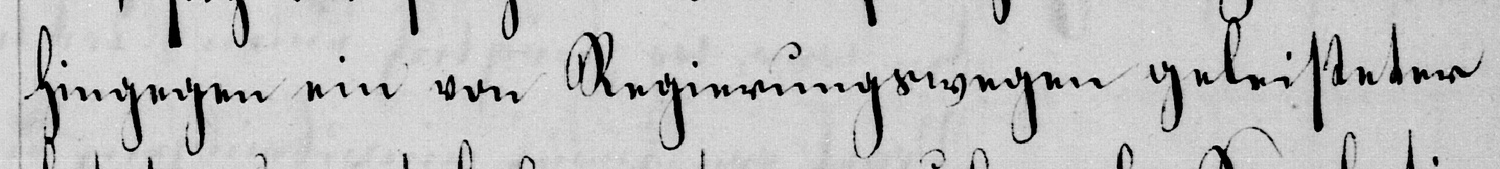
hingegen ein von Regierungswegen geleisteter
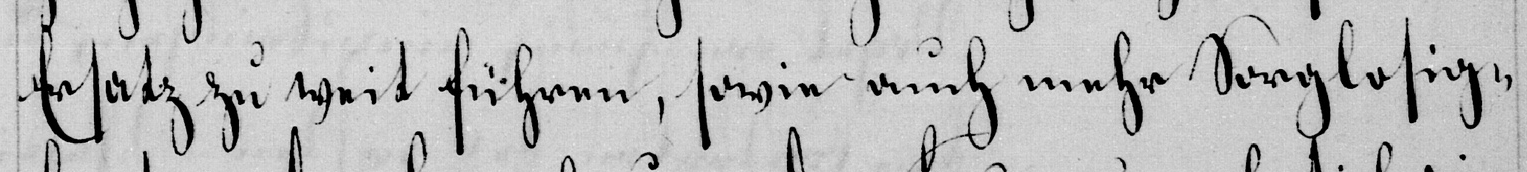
Ersatz zu weit führen, sowie auch mehr Sorglosig¬
